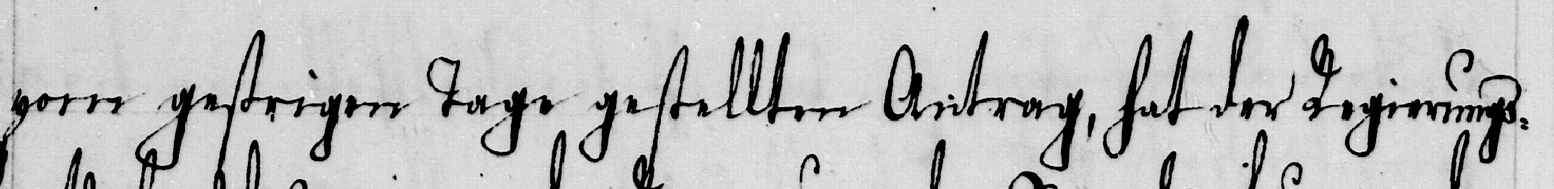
vom gestrigen Tage gestellten Antrag, hat der Regierungs¬
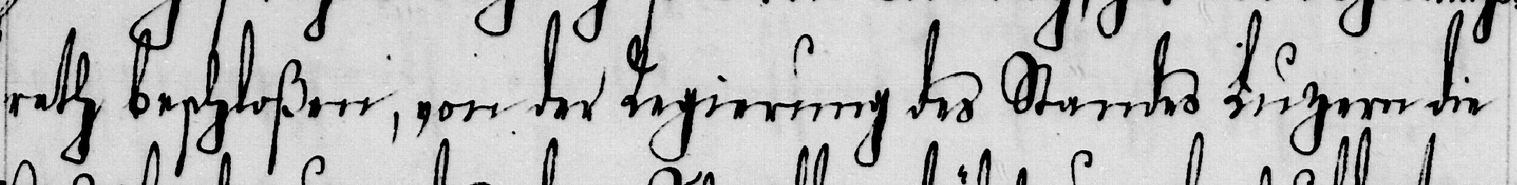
ath beschloßen, von der Regierung des Standes Luzern die
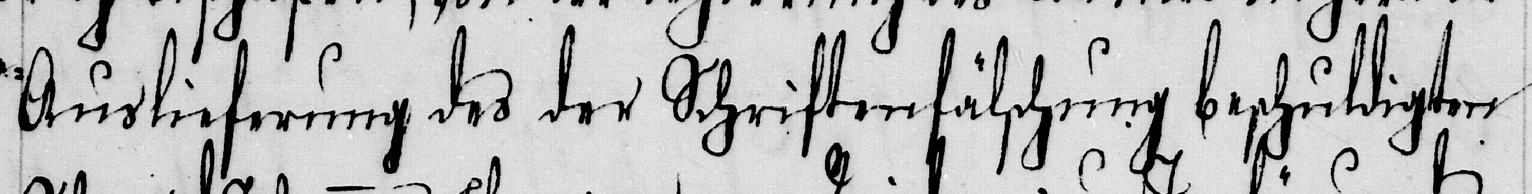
Auslieferung des der Schriftenfälschung beschuldigten
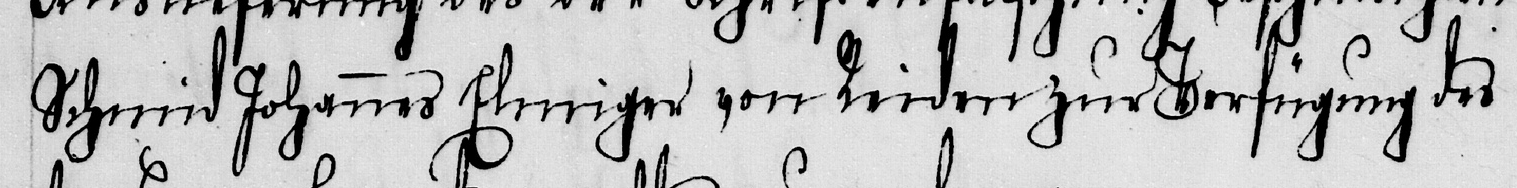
Schmid Johannes Elmiger von Reiden zur Verfügung des
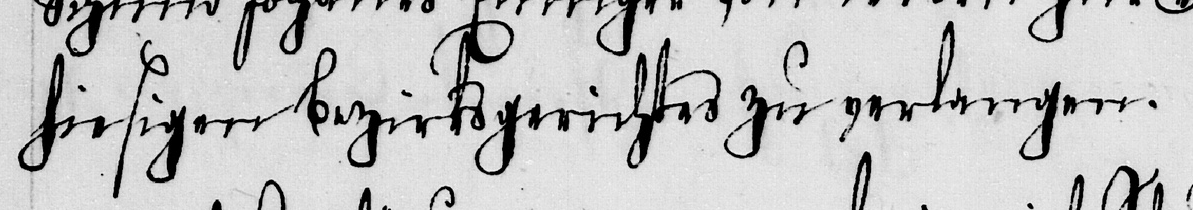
hiesigen Bezirksgerichtes zu verlangen.
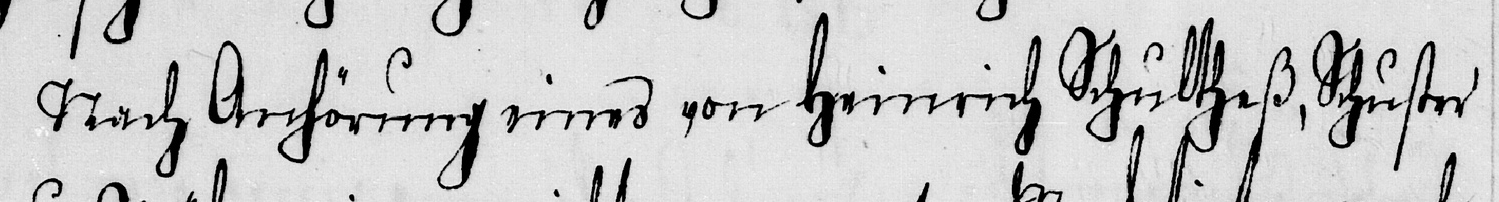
Nach Anhörung eines von Heinrich Schultheß, Schuster
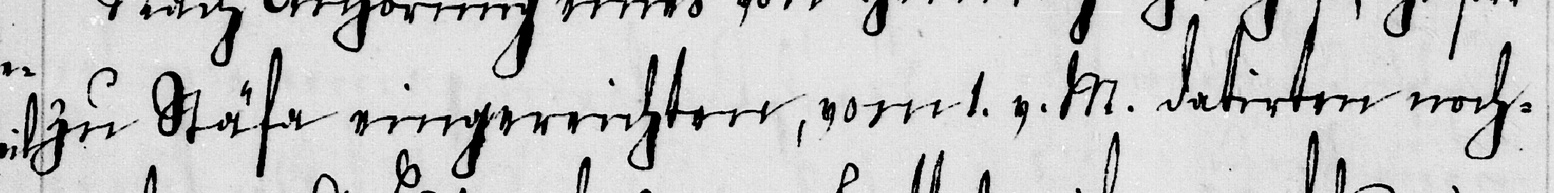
zu Stäfa eingereichten, vom 1. v. M. datirten noch¬
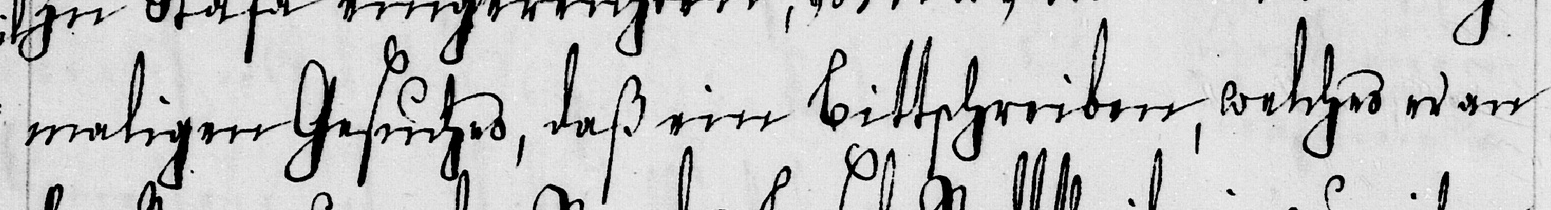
maligen Gesuches, daß ein Bittschreiben, welches er an
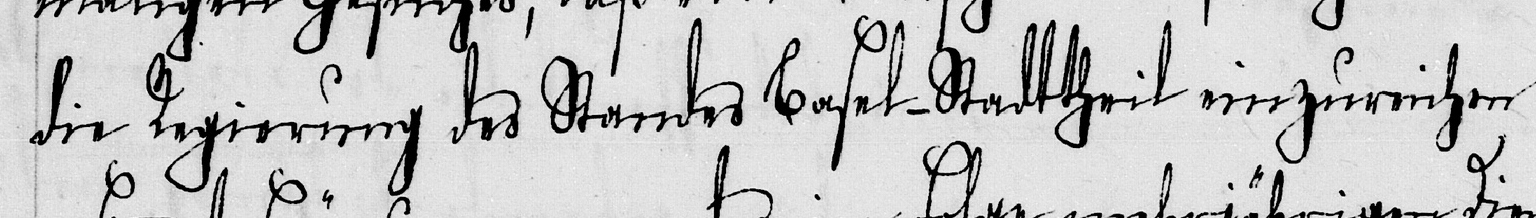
die Regierung des Standes Basel-Stadttheil einzureichen
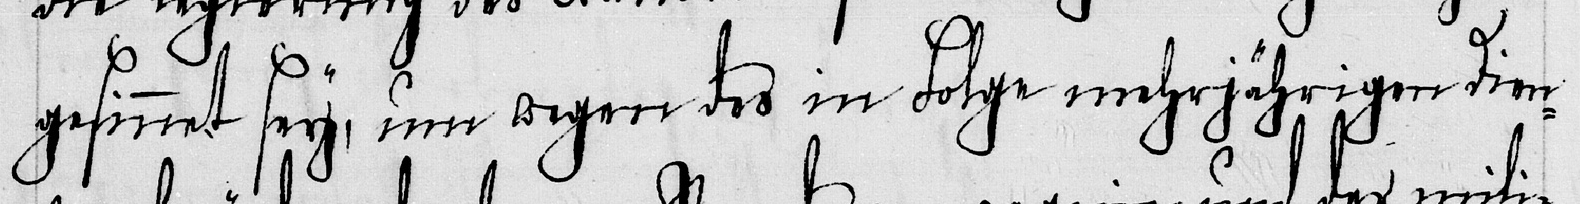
gesinnt sey, um wegen des in Folge mehrjährigen Dien¬
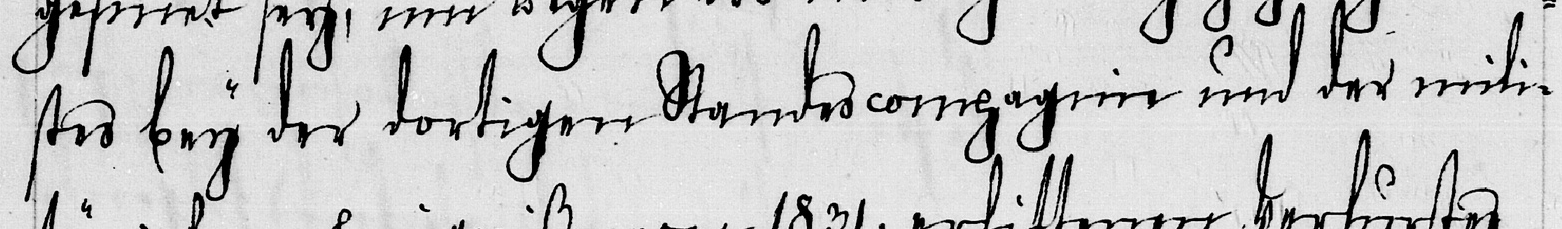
stes bey der dortigen Standescompagnie und der mili¬
